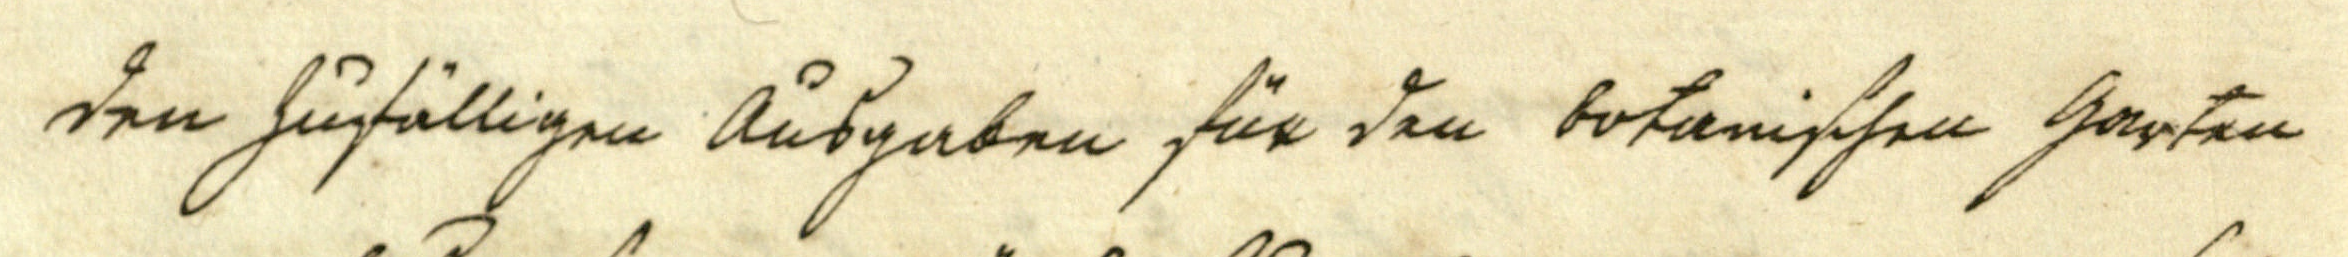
den zufälligen Ausgaben für den botanischen Garten
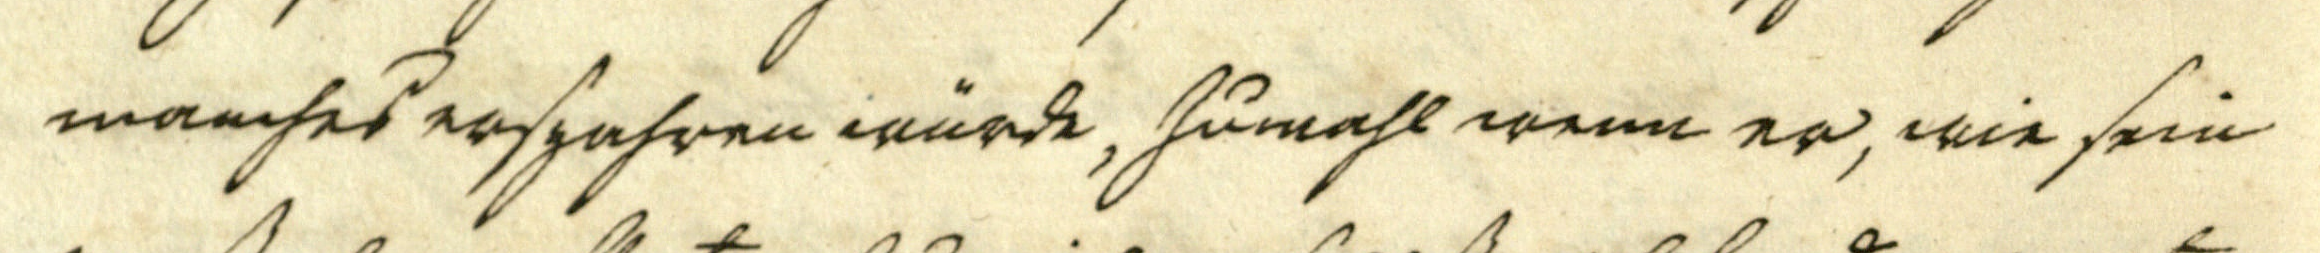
manches erspahren würde, zumahl wenn er, wie sein
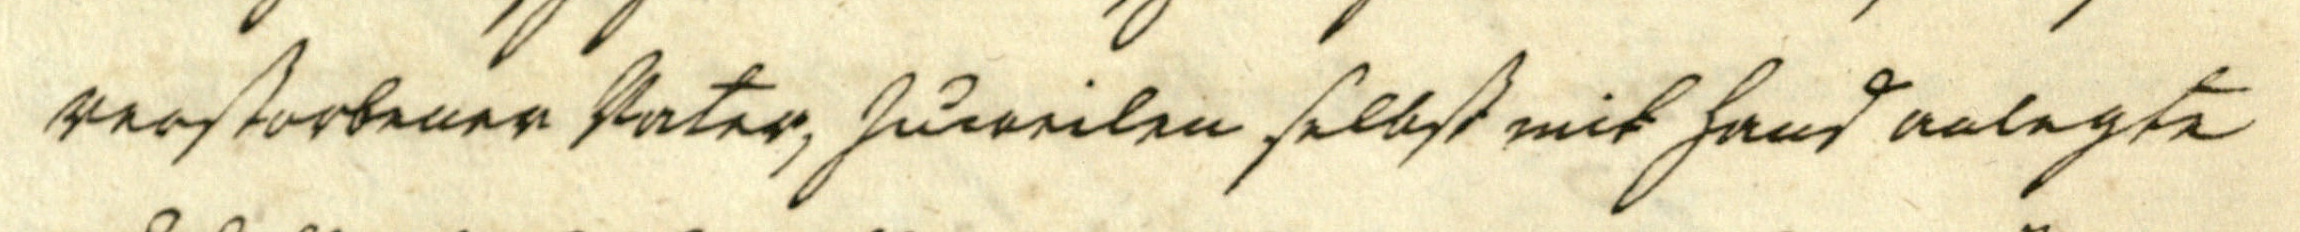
verstorbener Vater, zuweilen selbst mit Hand anlegte
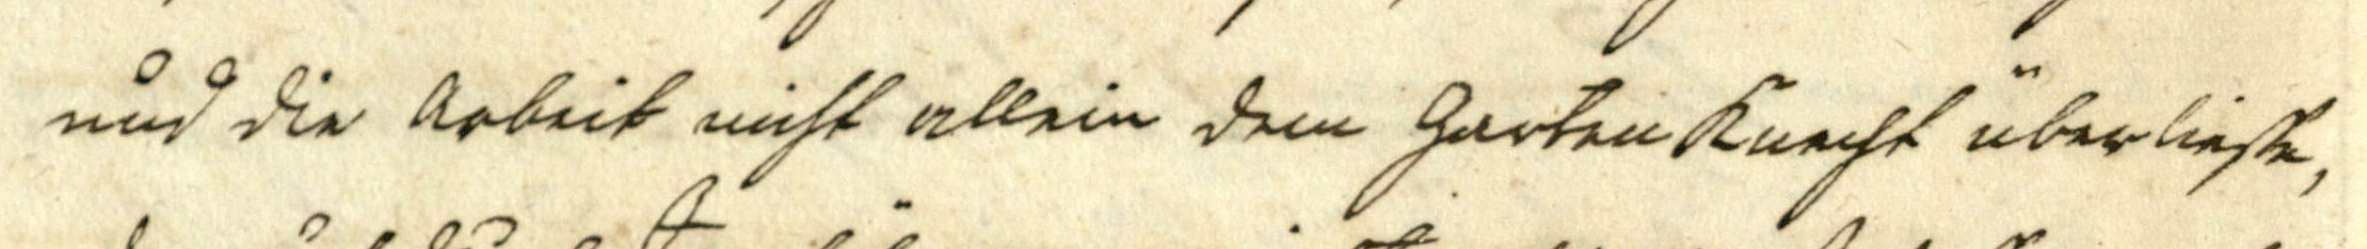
und die Arbeit nicht allein dem Gartenknecht überliesse,
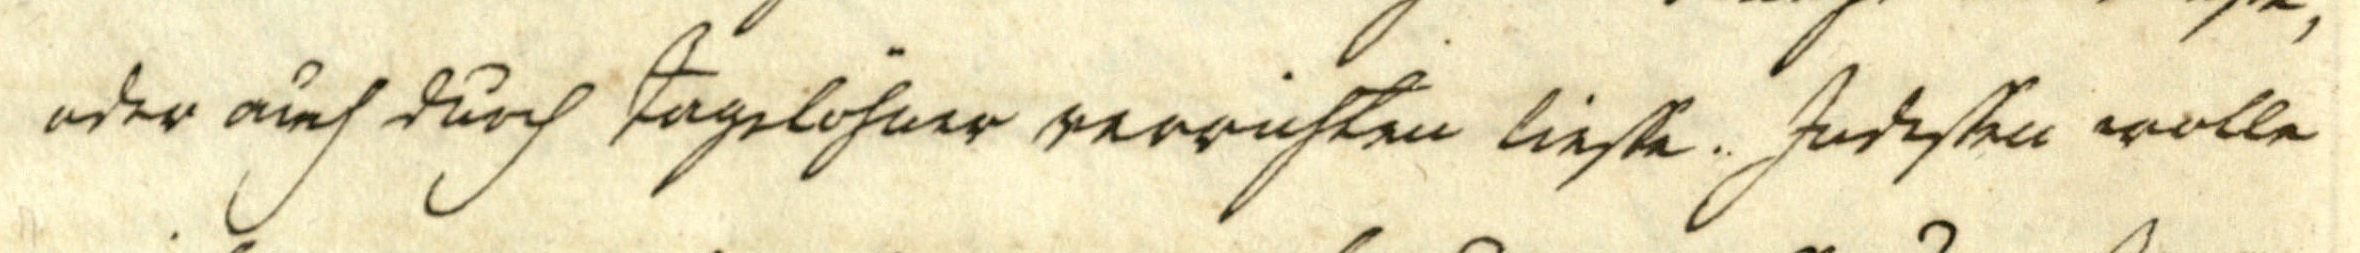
oder auch durch Tagelöhner verrichten liesse. Indessen wolle
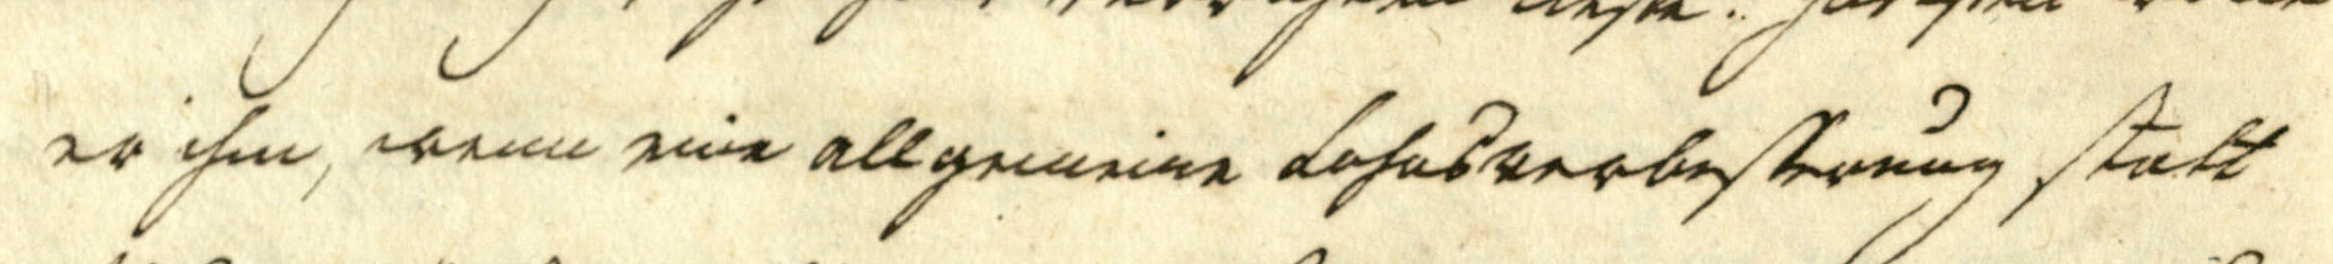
er ihm, wenn eine allgemeine Lohnsverbesserung statt
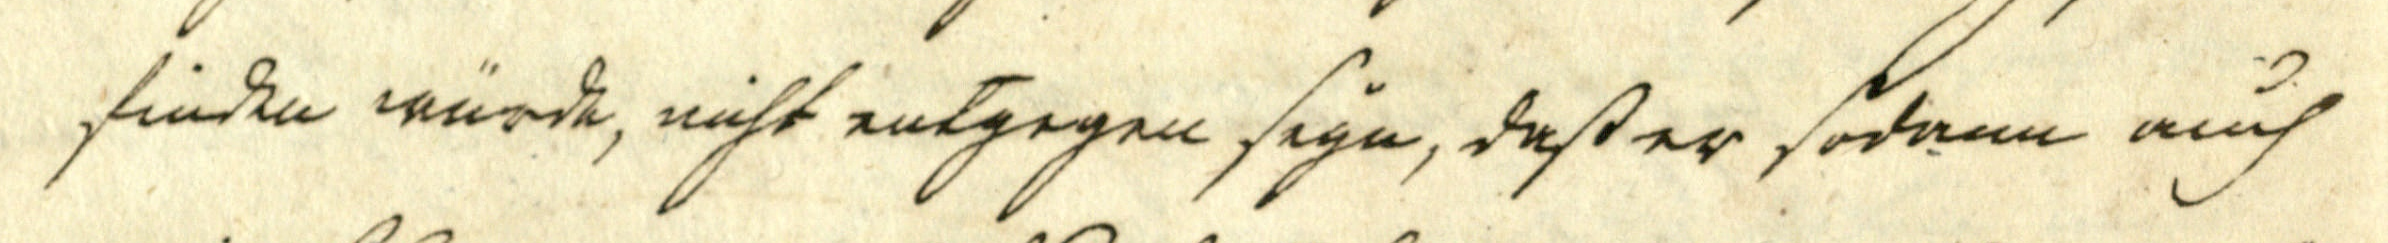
finden würde, nicht entgegen seÿn, daß er sodann auch
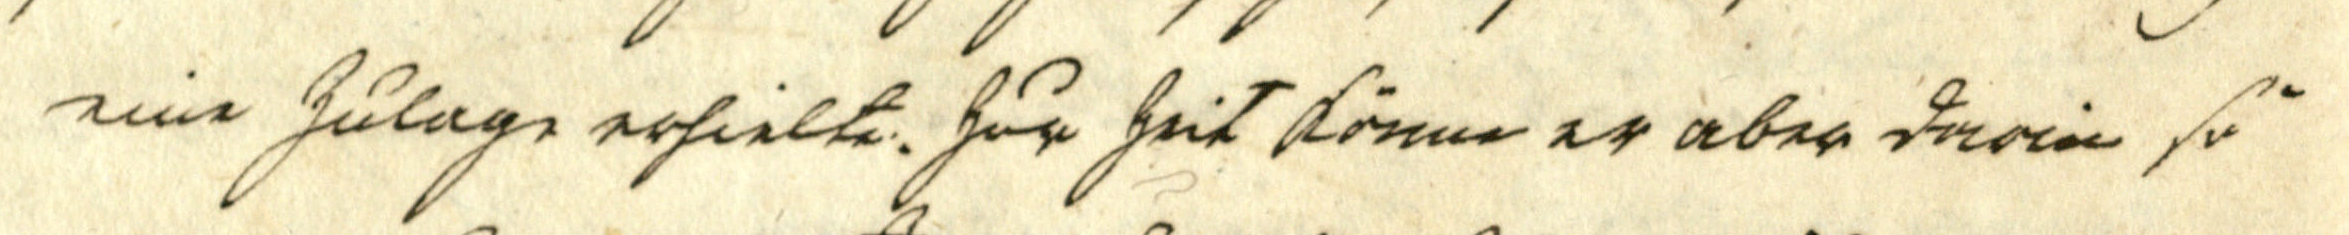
eine Zulage erhielte. Zur Zeit könne er aber darin so
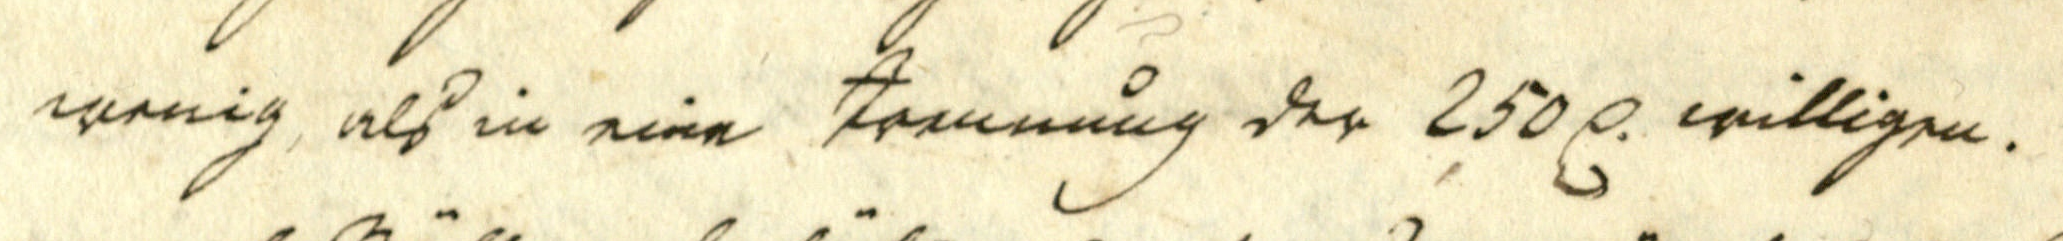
wenig als in eine Trennung der 250 l. willigen.
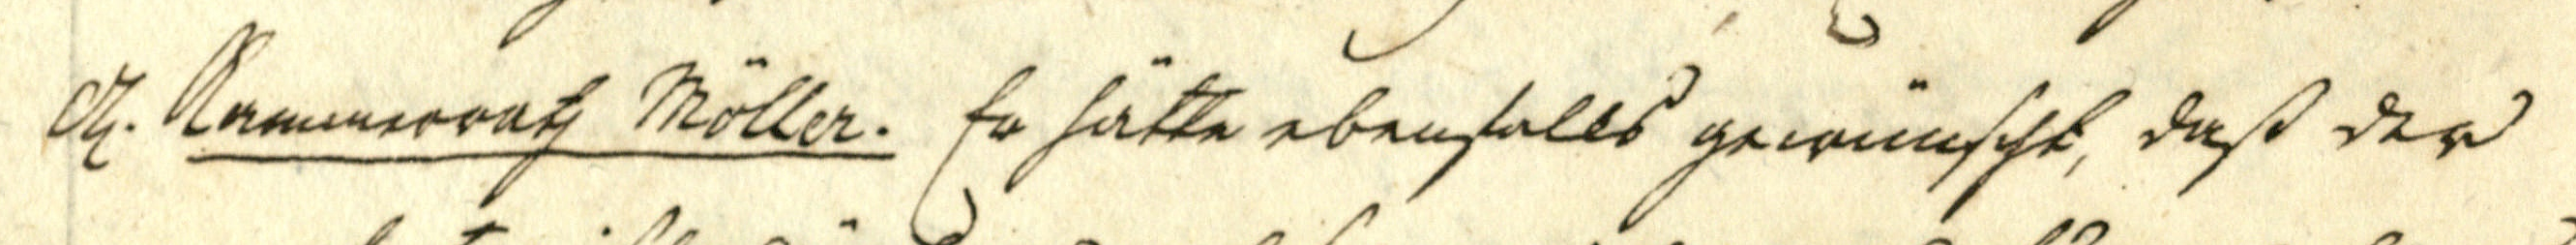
dh. Kammerrath Möller. Er hätte ebenfalls gewünscht, daß der
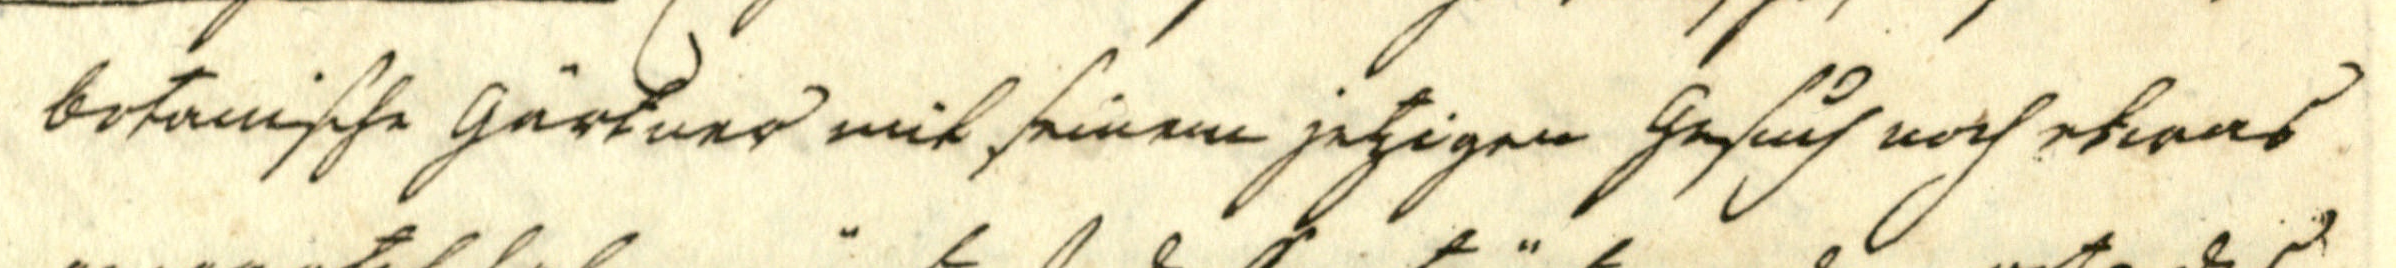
botanische Gärtner mit seinem jetzigen Gesuch noch etwas
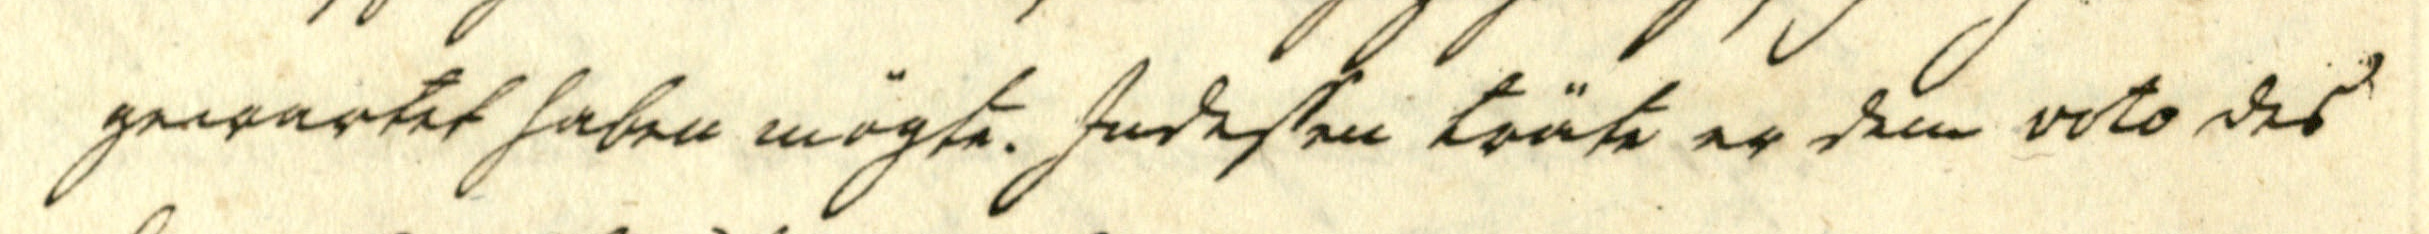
gewartet haben mögte. Indessen träte er dem voto des
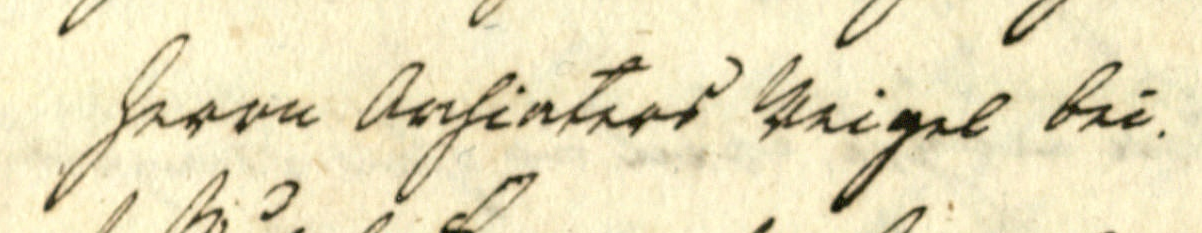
Herrn Archiaters Weigel bei.
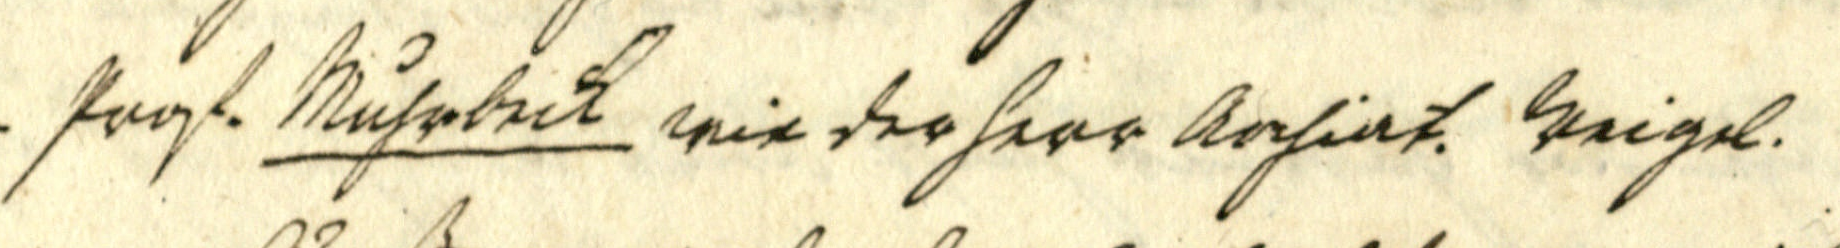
Prof. Muhrbeck wie der Herr Archiat. Weigel.
